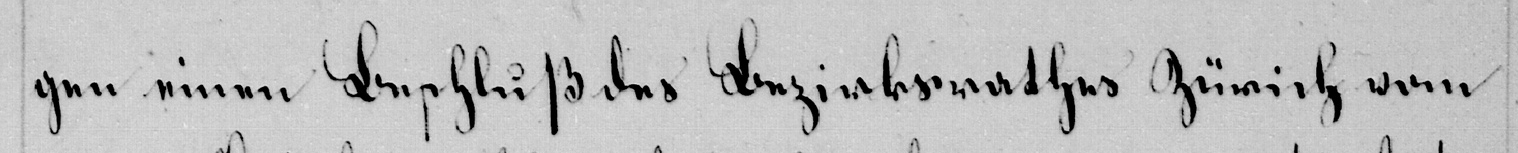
gen einen Beschluß des Bezirksrathes Zürich vom
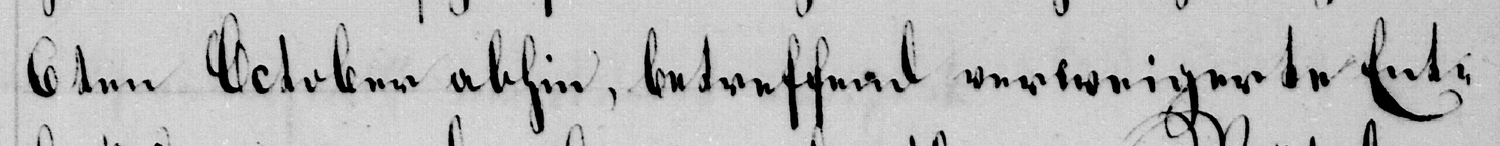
6ten October abhin, betreffend verweigerte Ent¬
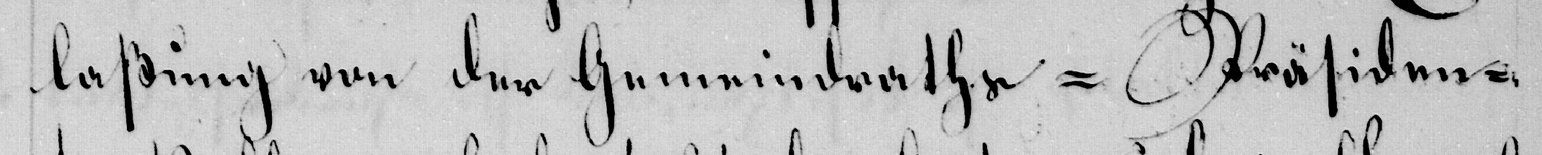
laßung von der Gemeindraths-Präsiden¬
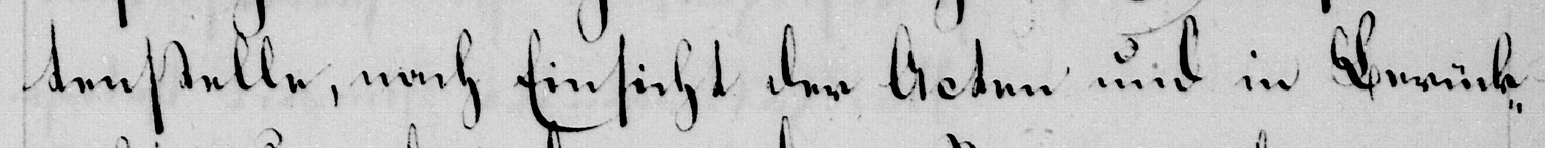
tenstelle, nach Einsicht der Acten und in Berück¬
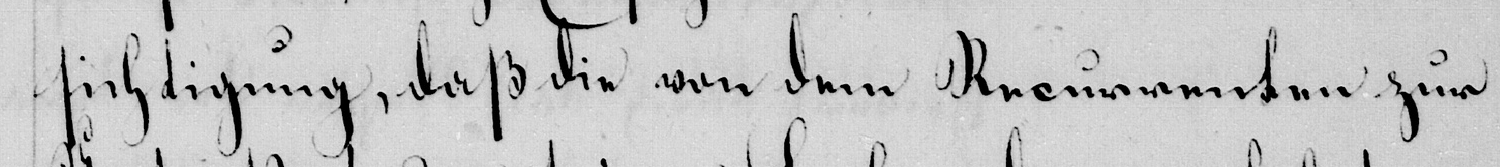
sichtigung, daß die von dem Recurrenten zur
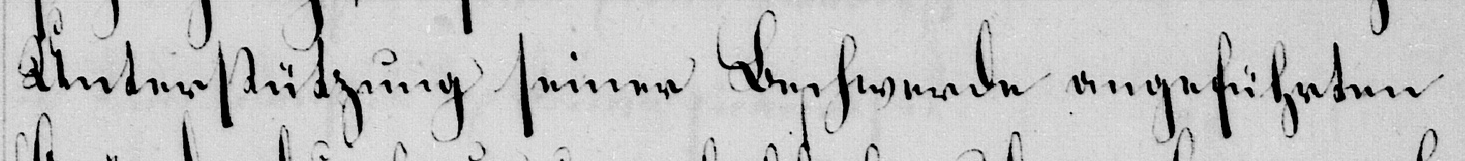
Unterstützung seiner Beschwerde angeführten
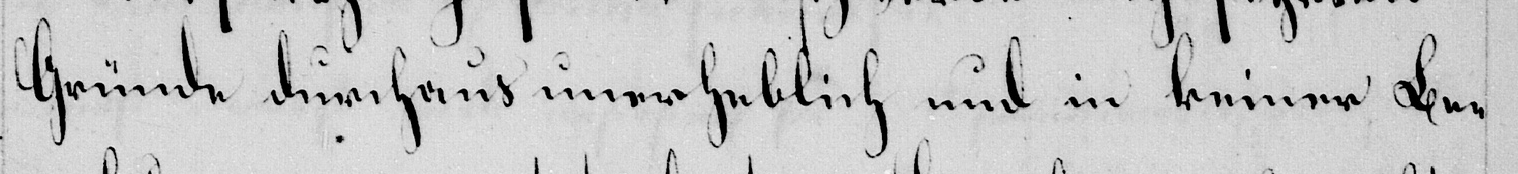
Gründe durchaus unerheblich und in keiner Be¬
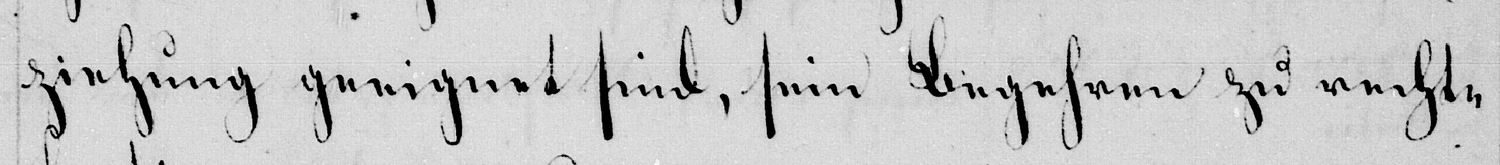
ziehung geeignet sind, sein Begehren zu recht¬
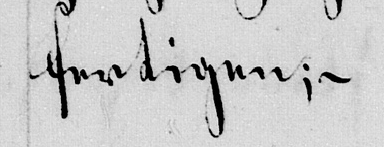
fertigen: –
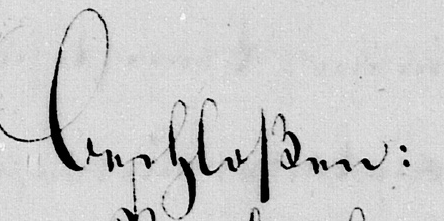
beschloßen:
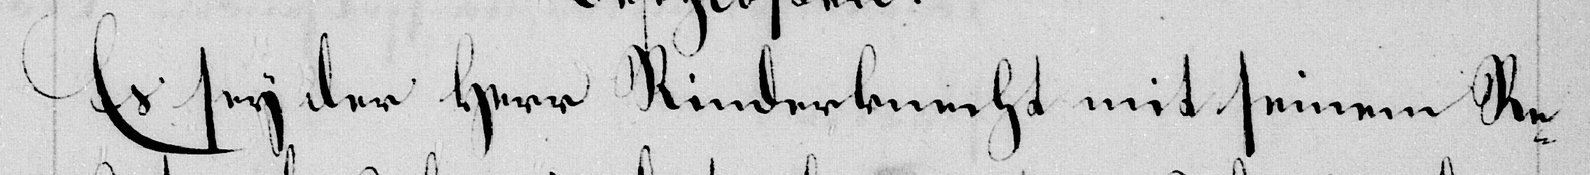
Es sey der Herr Rinderknecht mit seinem Re¬
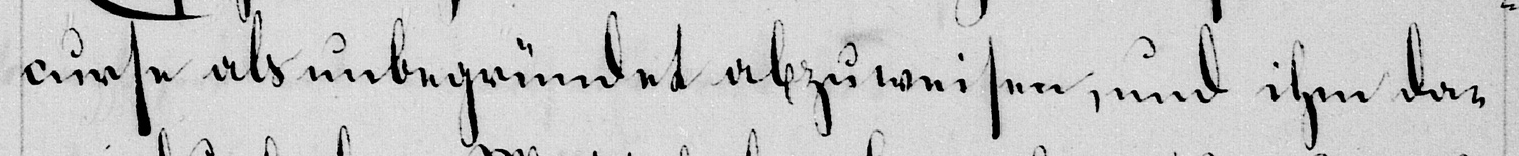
curse als unbegründet abzuweisen, und ihm da¬
